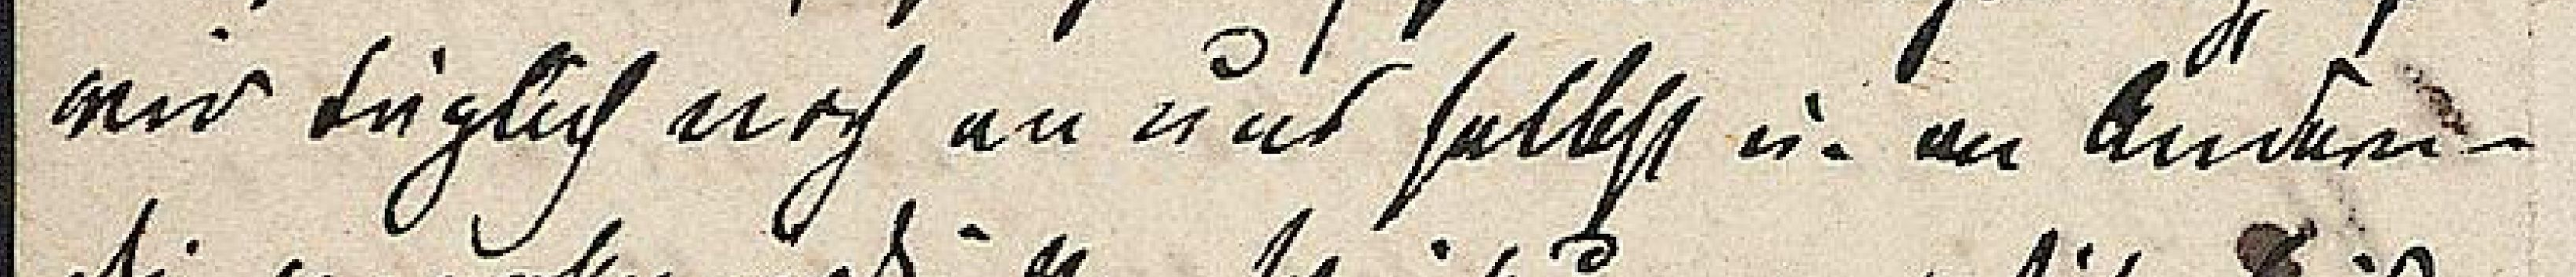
wir täglich noch an uns selbst u. an Andern
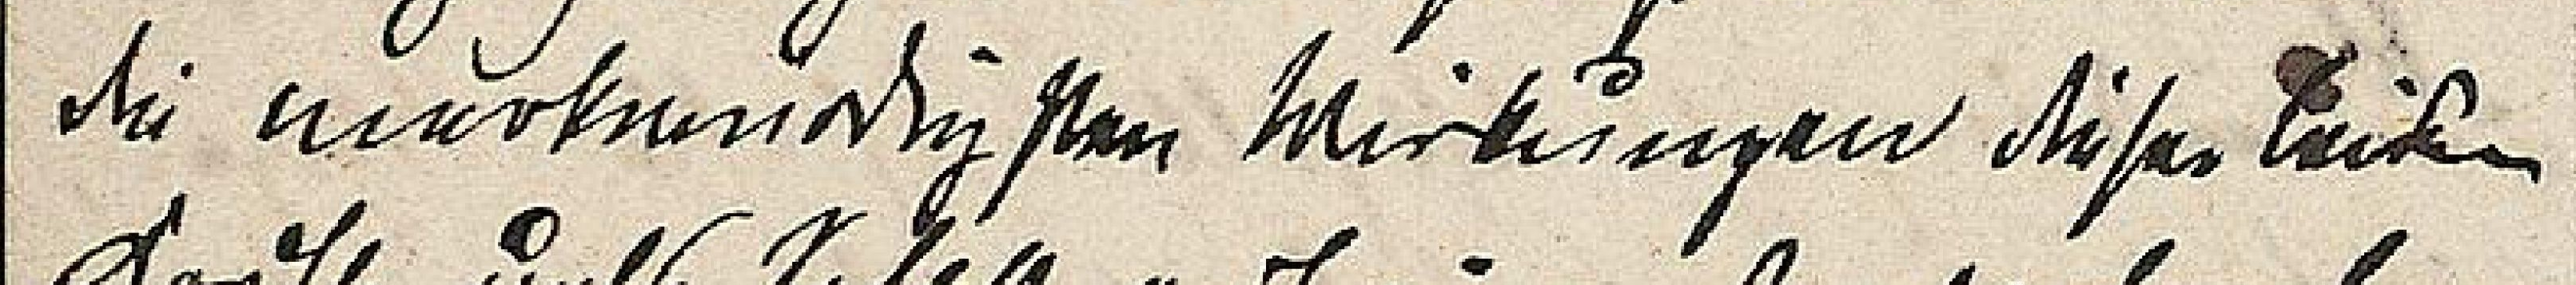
die merkwürdigsten Wirkungen dieser beiden
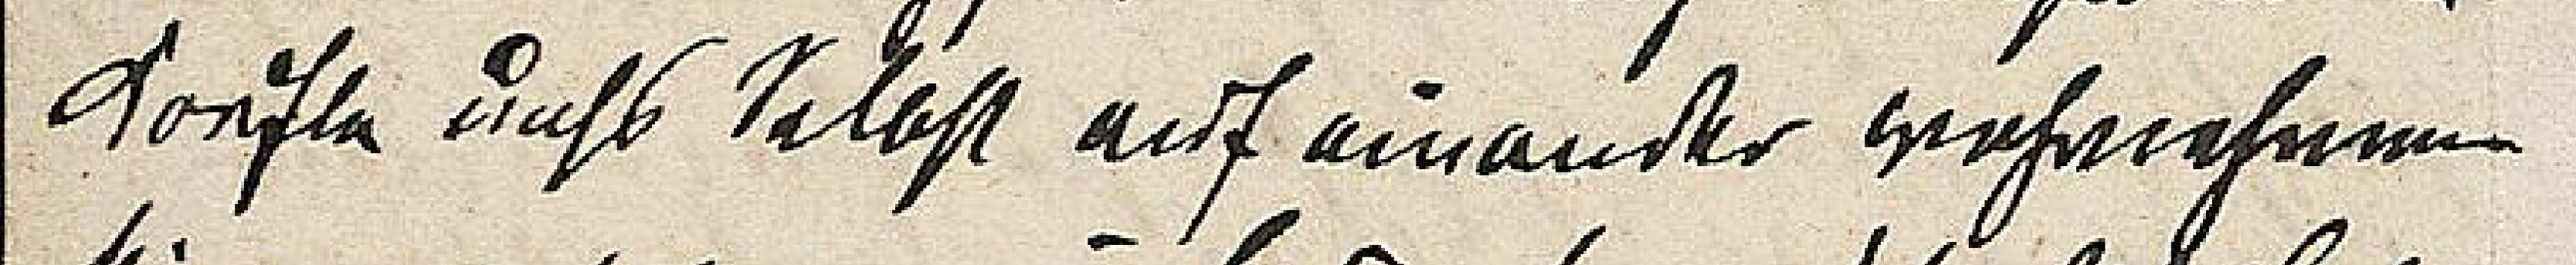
Kräfte uns selbst aufeinander wahrnehmen
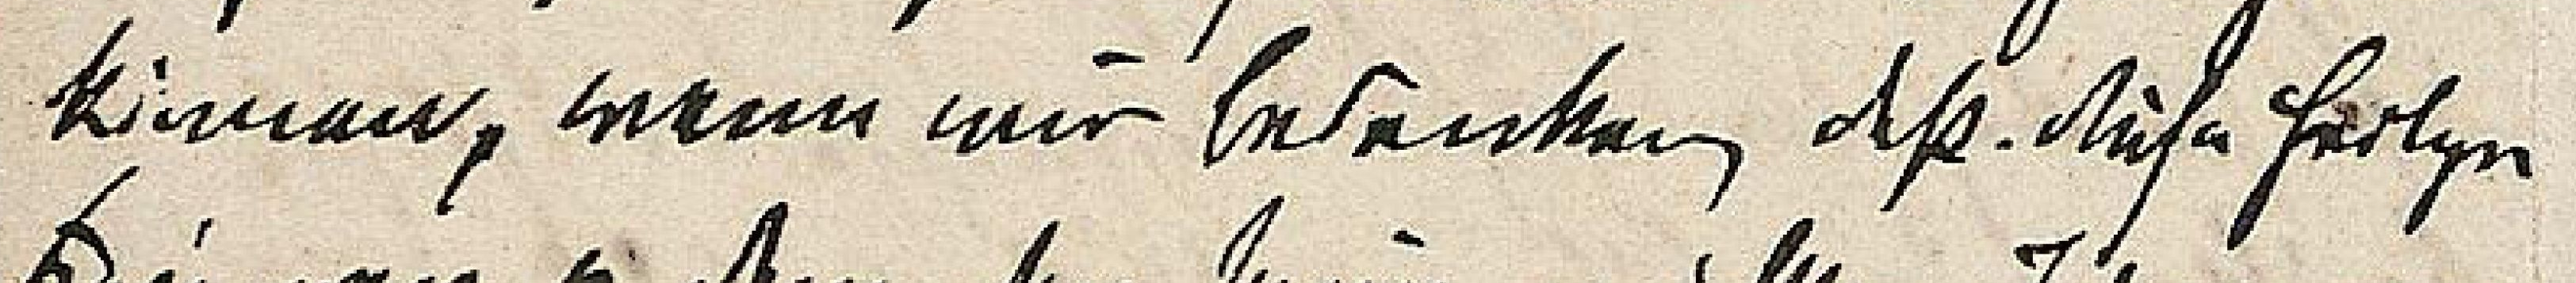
können, wenn wir bedenken, daß. diese Heilgn
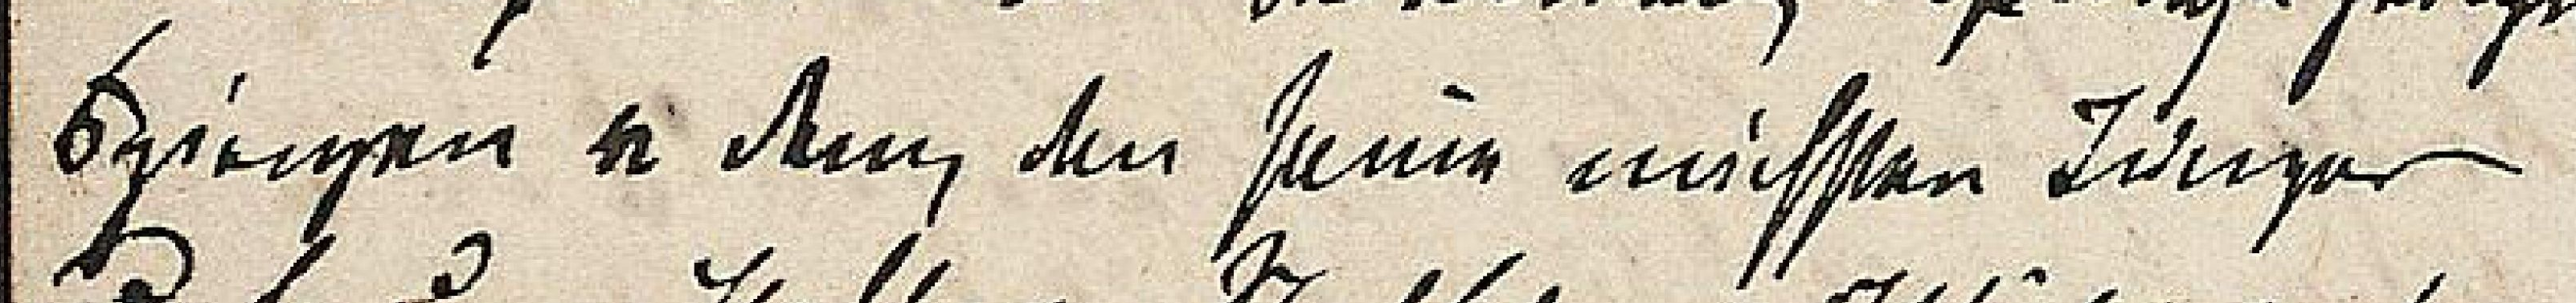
sgingen v dem, den seine nächsten Jüngern
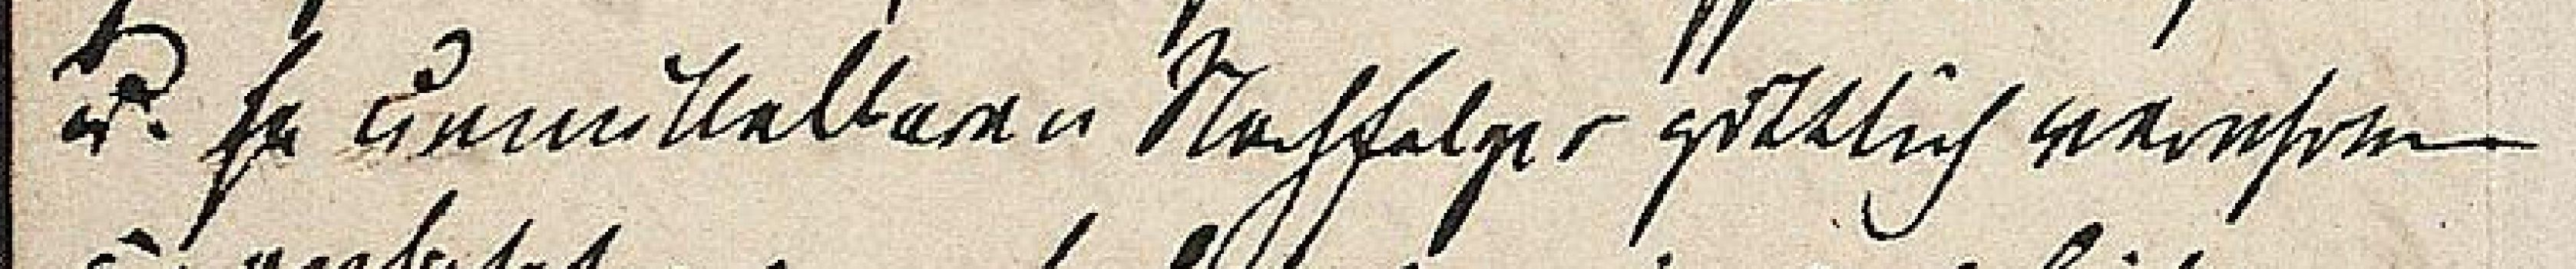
u. sn unmittelbaren Nachfolger göttlich verehren
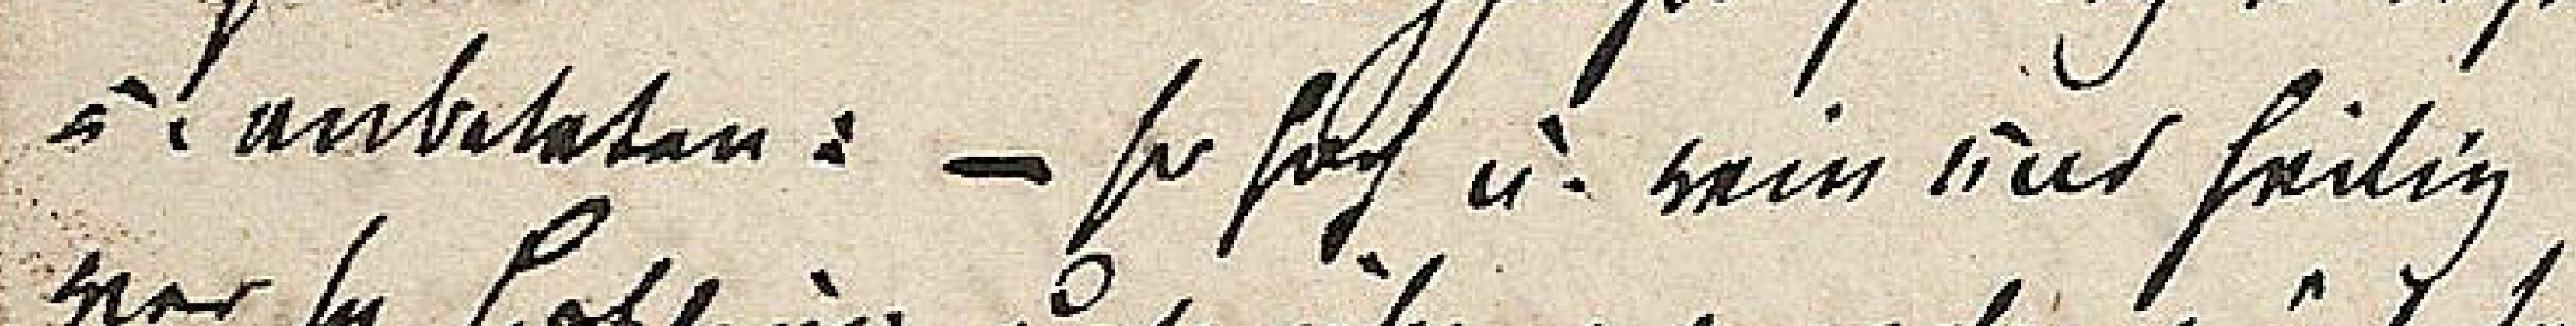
u. anbeteten: so hoch u. rein und heilig
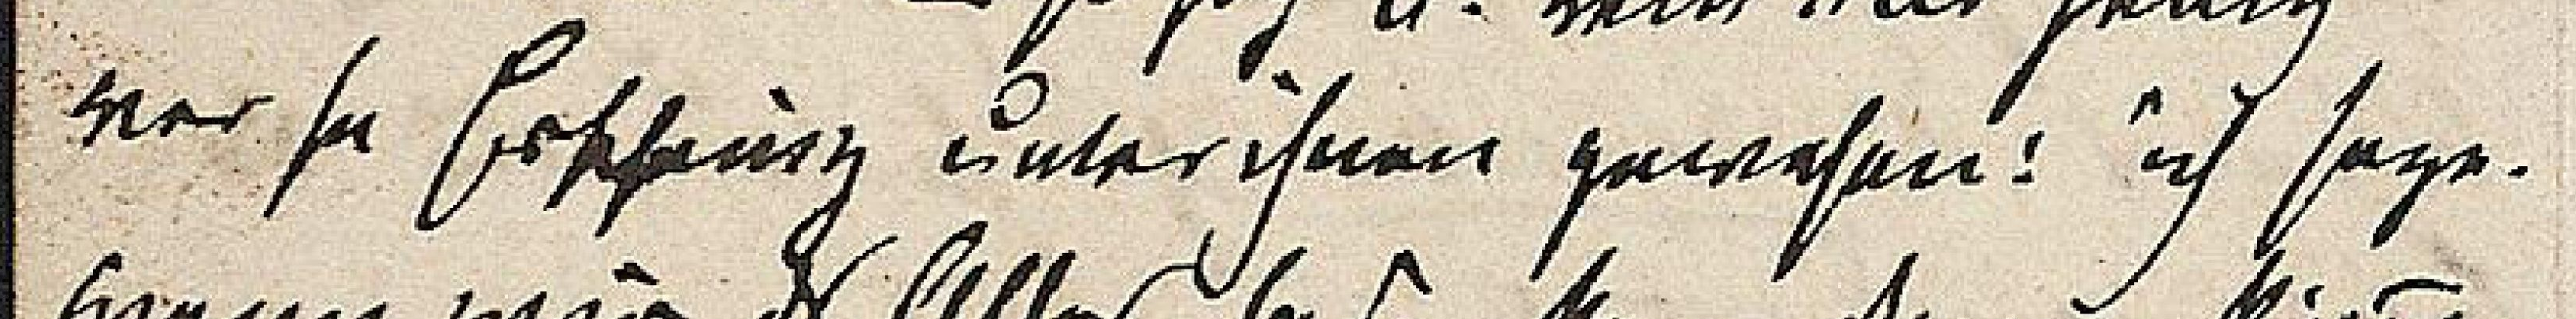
war sn Erscheing unter ihnen gewesen: ich sagen.
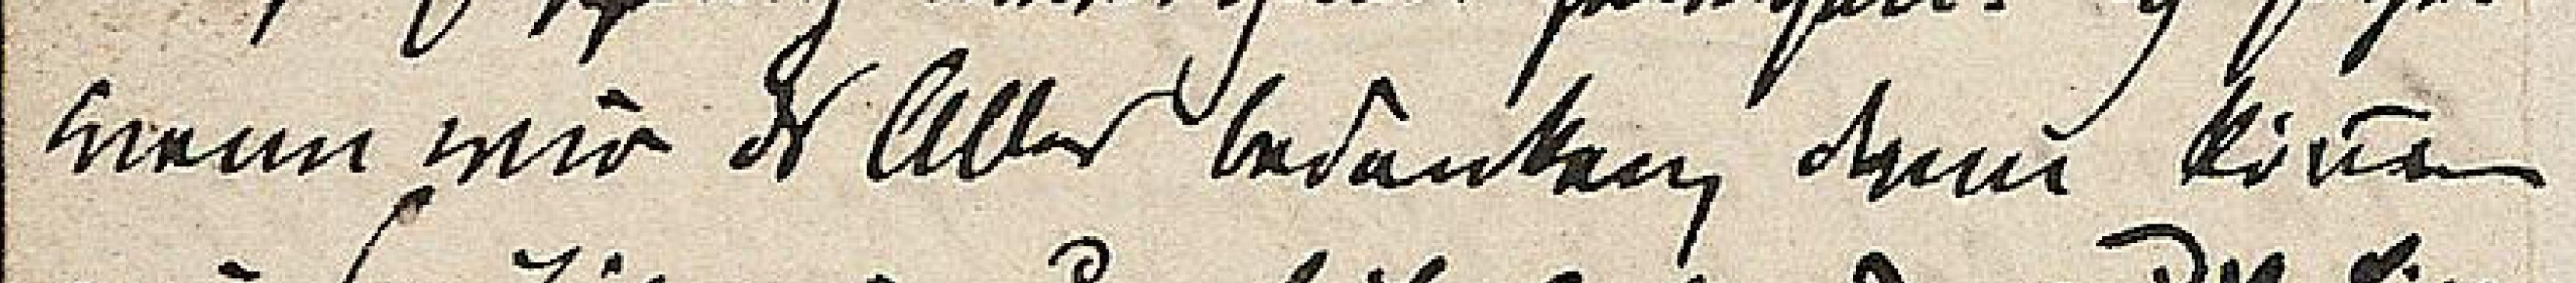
wenn wir ds Alles bedenken, dann könen
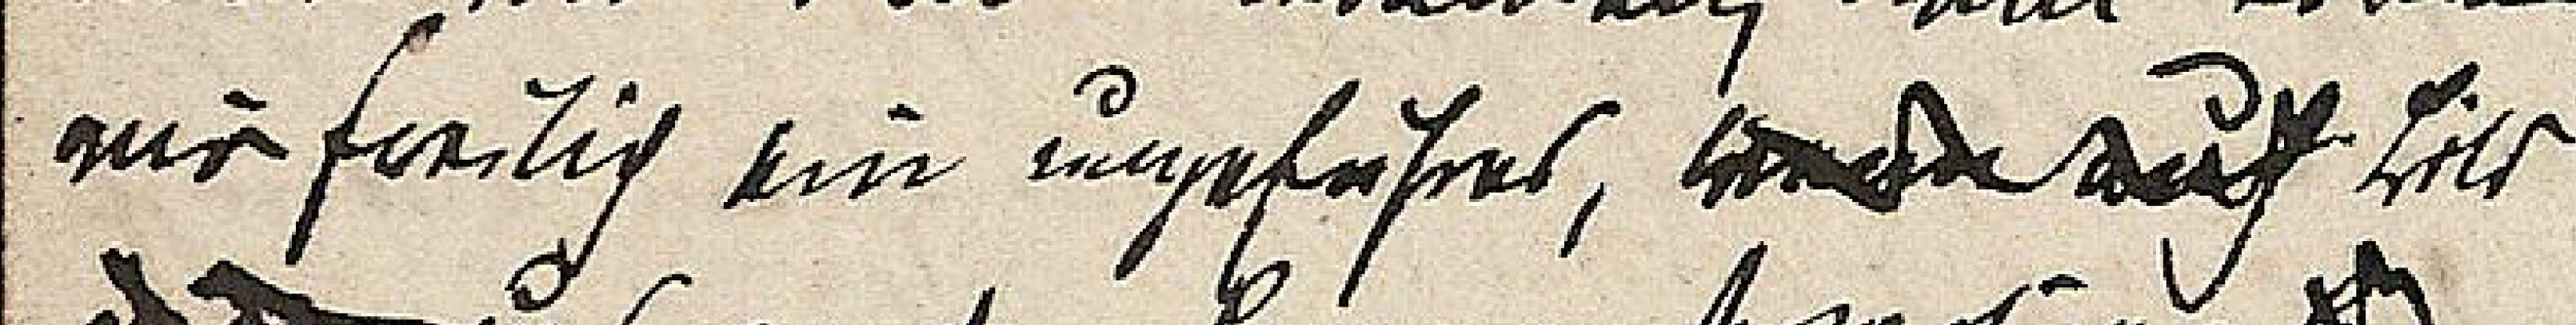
wir freilich ein ungefähres, wenn auch Bild
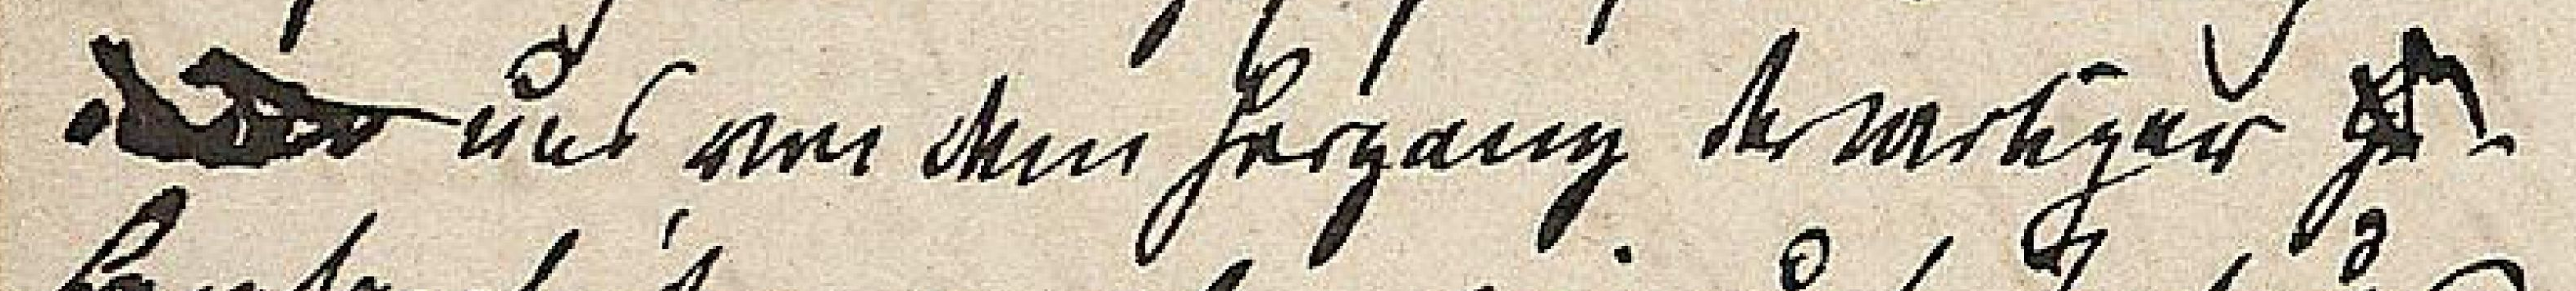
um uns von dem Hergang damaliger Ge¬
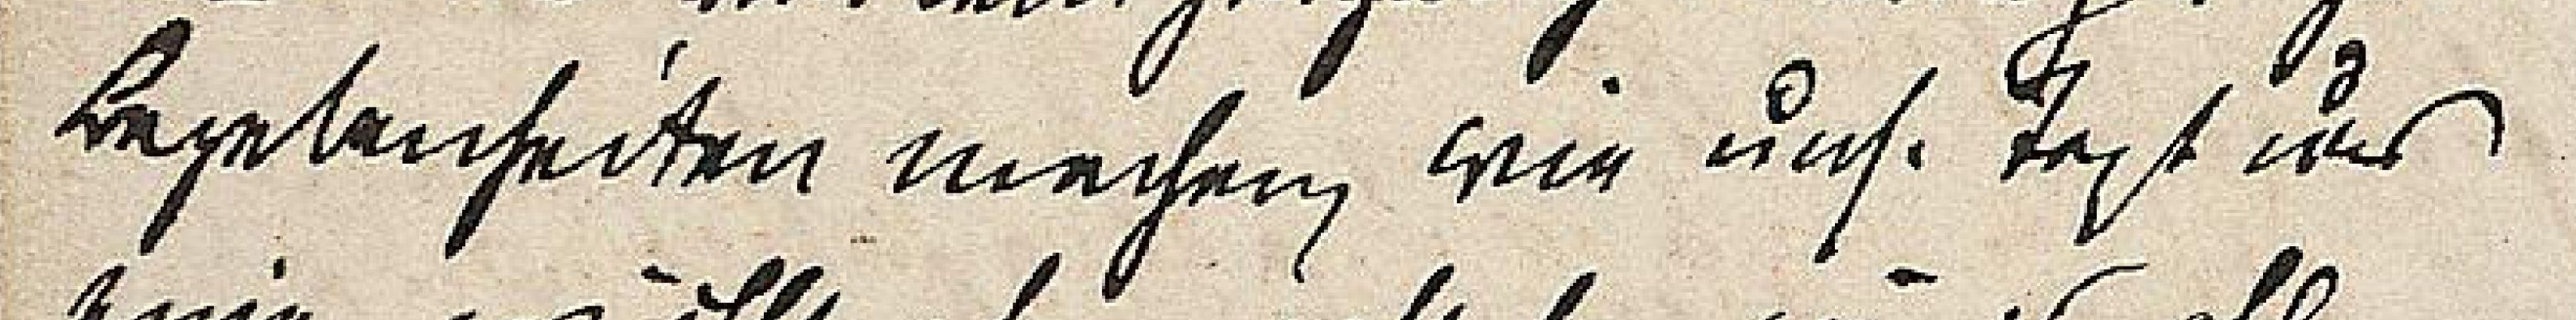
Begebenheiten machen, wie uns. Test und
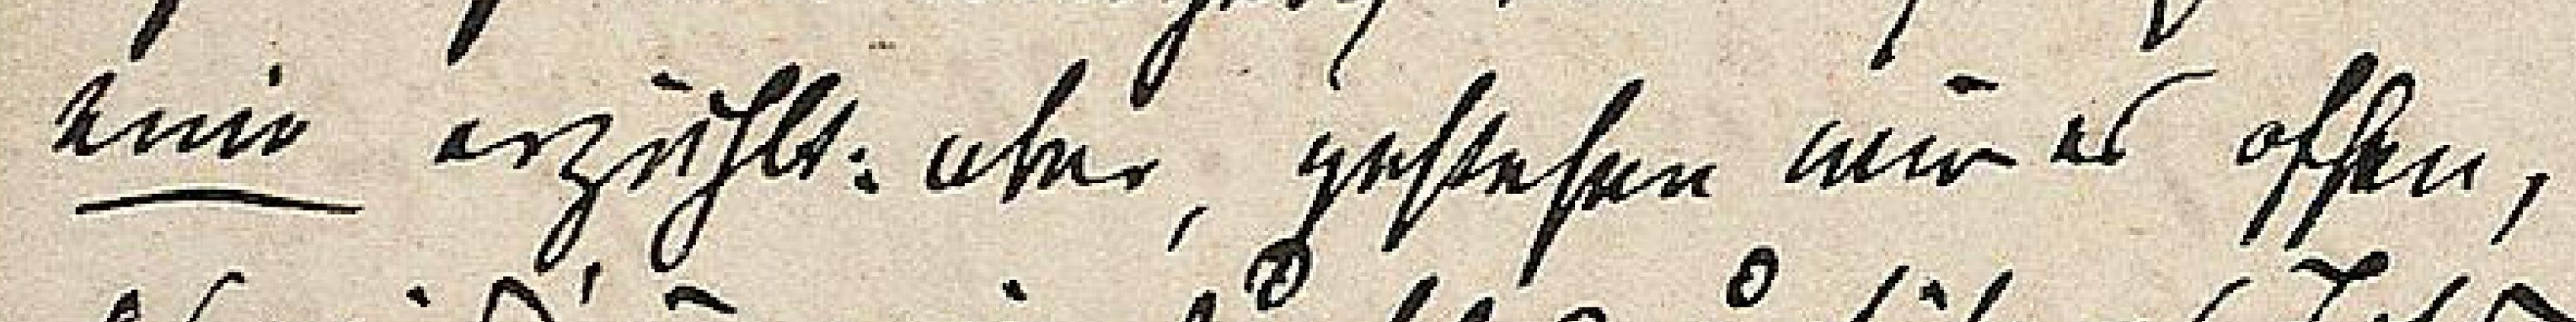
eine erzählt: aber, gestehen wir es offen,
